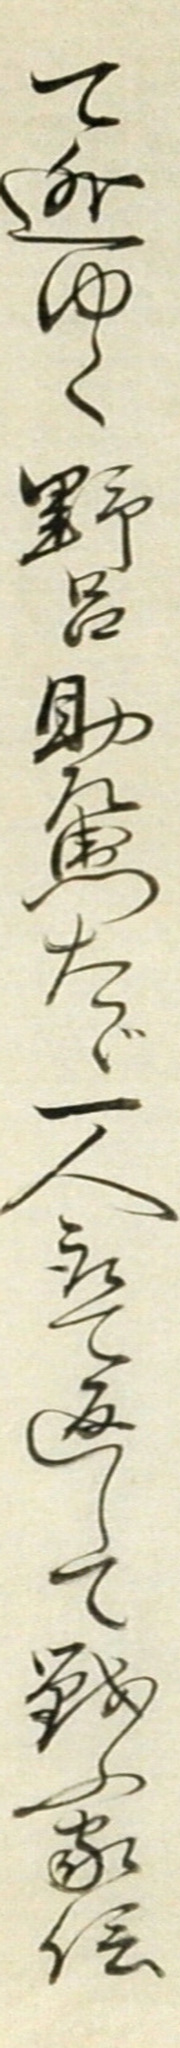て逃ゆく野呂助左衛門たゞ一人取て返して戦ふ家信
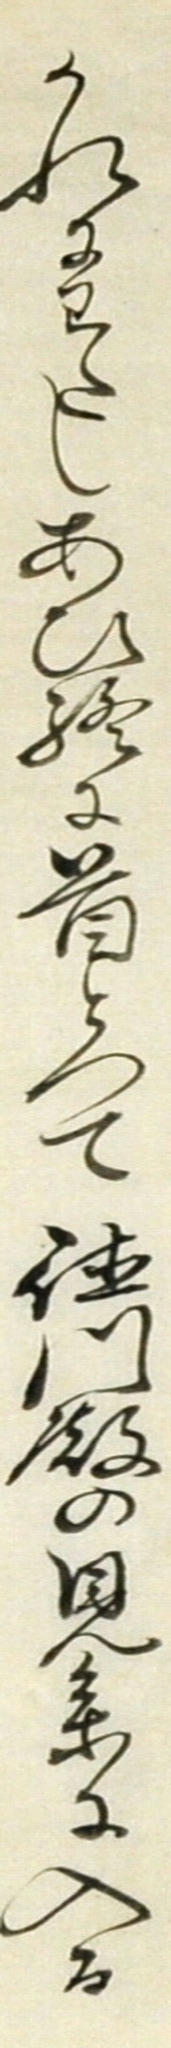かれにわたしあひ終に首とつて徳川殿の見参に入る
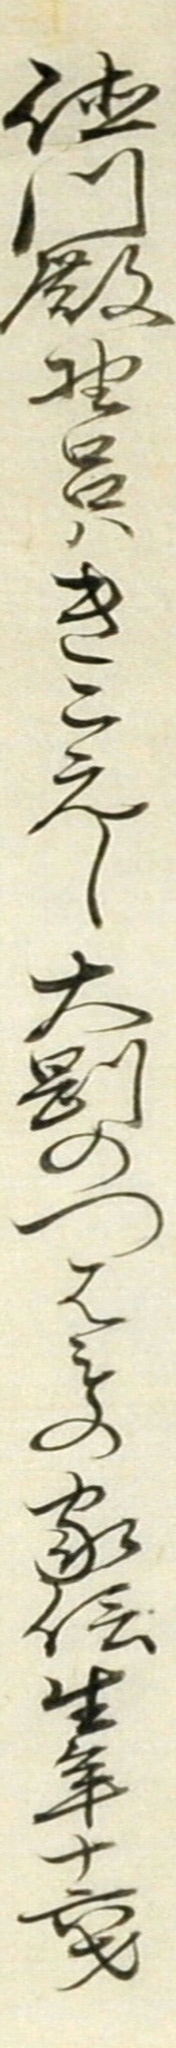徳川殿野呂はきこえし大剛のつはもの家信生年十六才
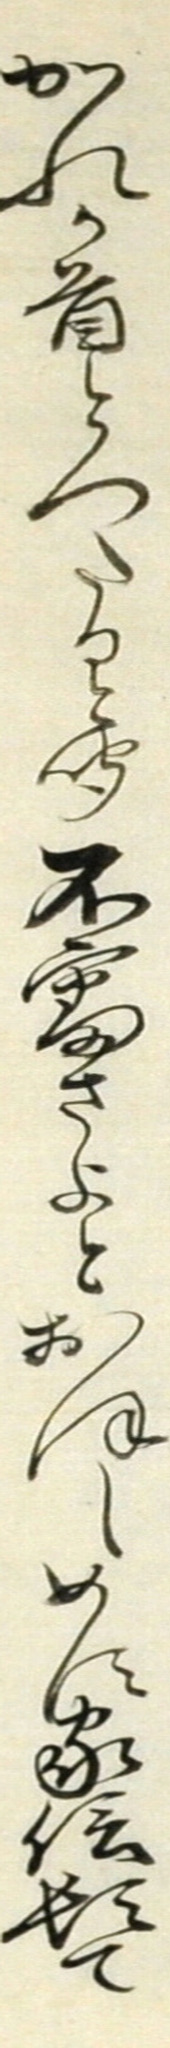かれか首とつたると聞不審さよとおほしめす家信頓て
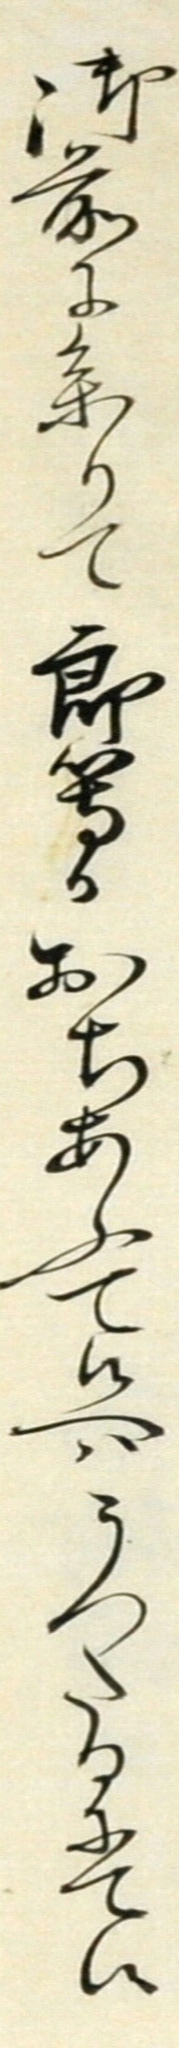御前に参りて郎等かおちあふて候へはうつたるにて候
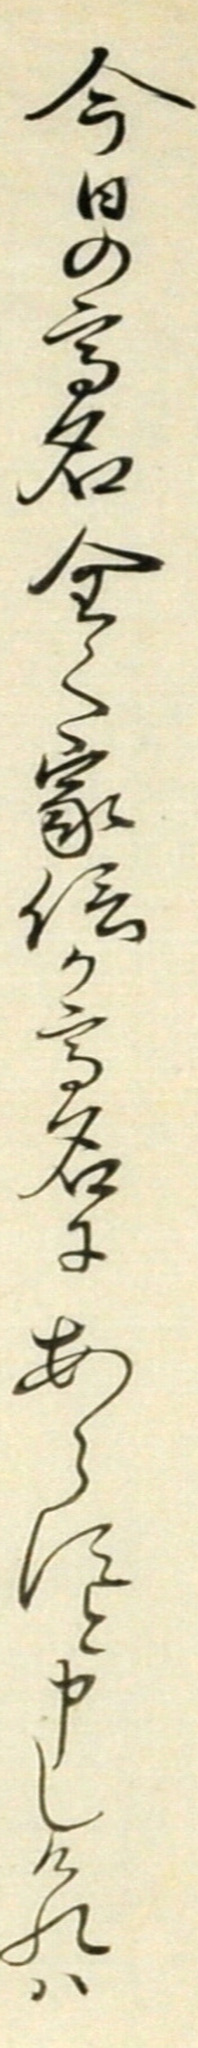今日の高名全く家信か高名にあらすと申しけれは
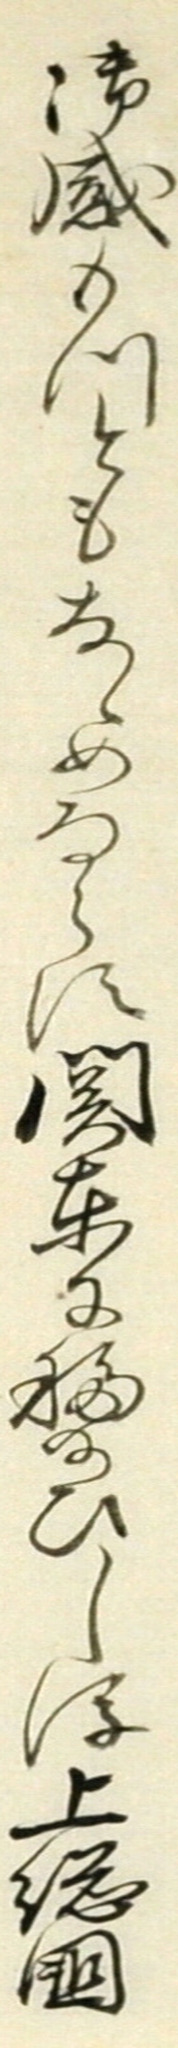御感もつともなゝめならす関東に移給ひし後上総国
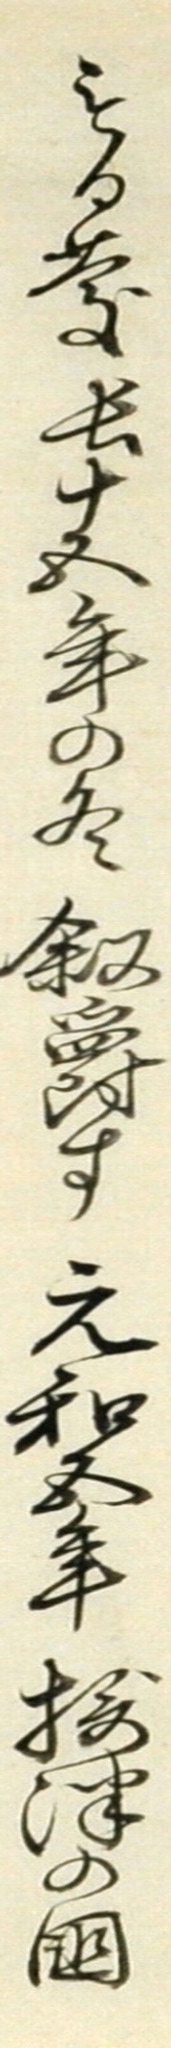もる慶長十五年の冬叙爵す元和五年摂津の国
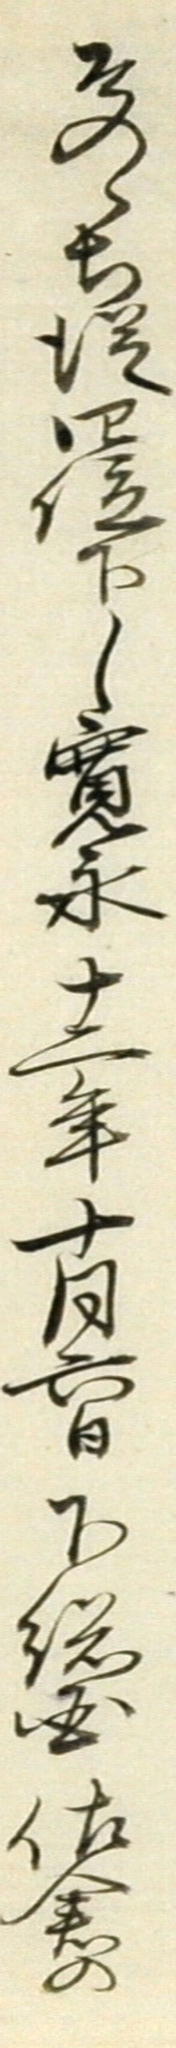そのゝち従四位下し寛永十二年十月六日下総国佐倉の
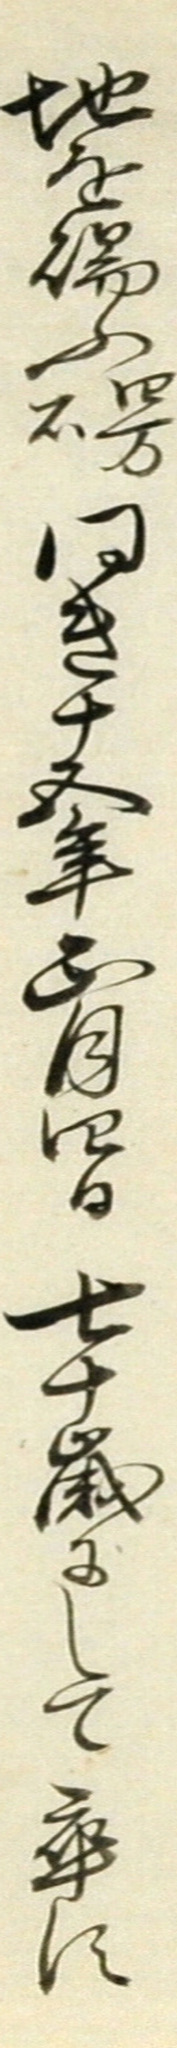地を賜ふ四万石同き十五年正月四日七十歳にして卒す
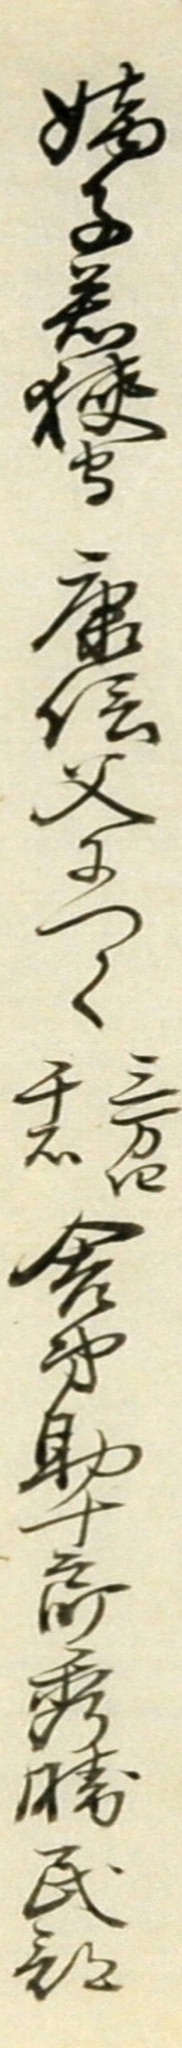嫡子若狭守康信父につく三万四千石舎弟助十郎秀勝民部

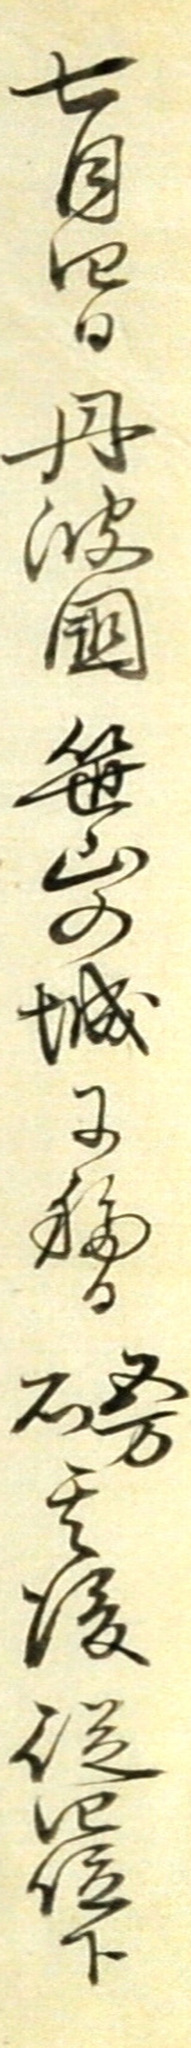七月四日丹波国笹山の城に移る五万石其後従四位下
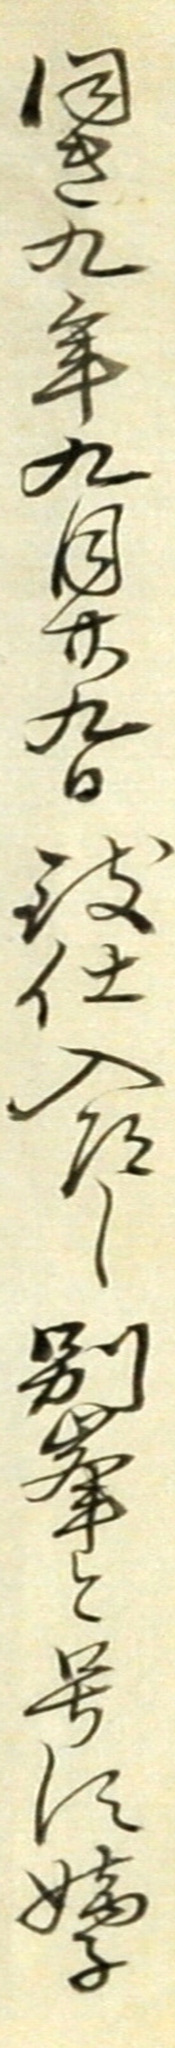同き九年九月廿九日致仕入道し別峯と号す嫡子
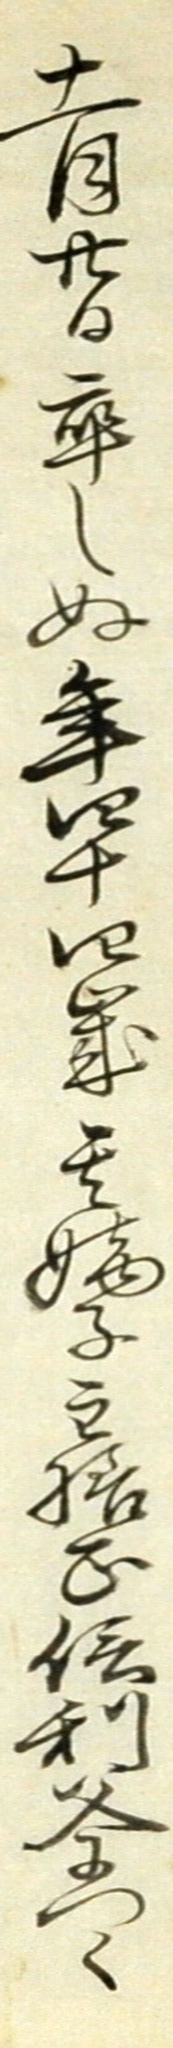十一月廿日卒しぬ年四十四歳其嫡子主膳正信利父につく
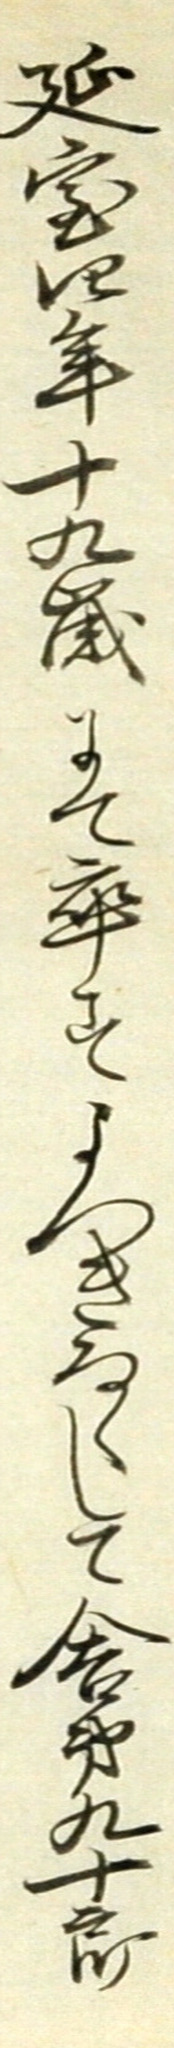延宝四年十九歳にて卒すよつきなくして舎弟九十郎
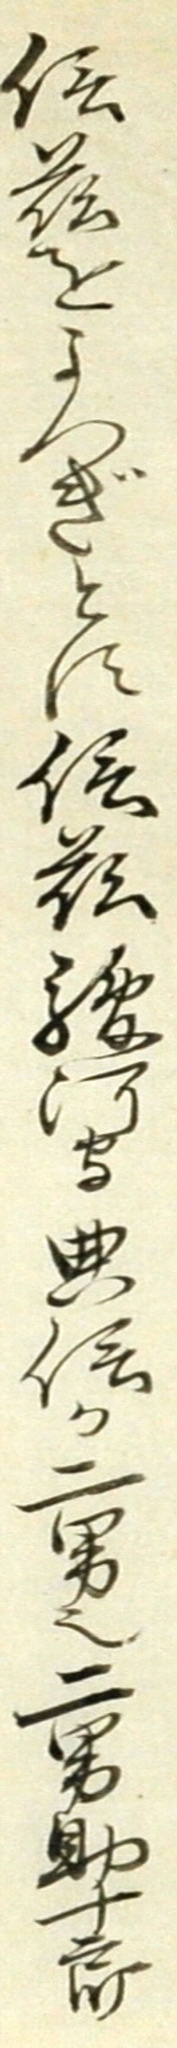信茲をよつぎとす信茲駿河守典信か二男也二男助十郎
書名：藩翰譜（二・三）
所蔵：伊那市立高遠町図書館・合同会社AMANE
